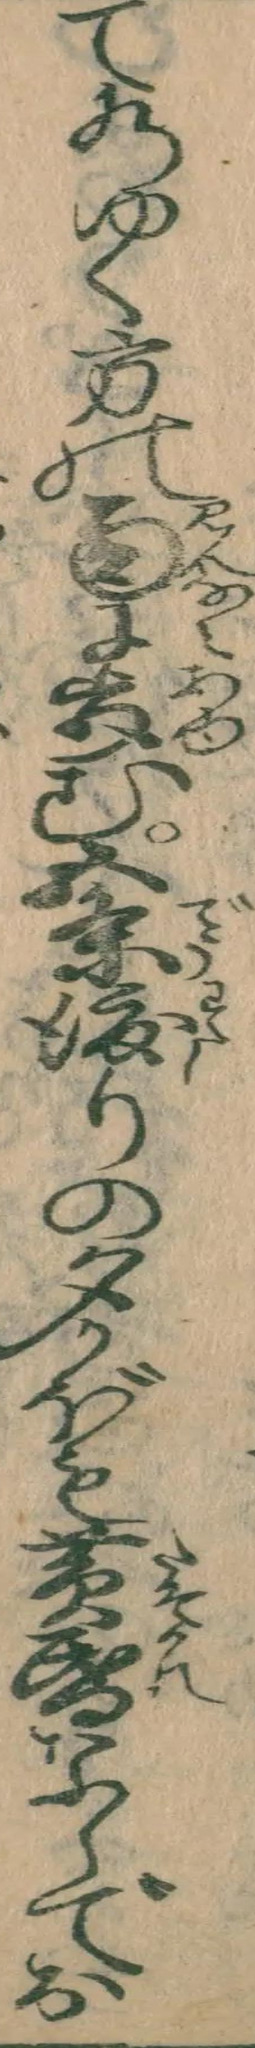て水ゆく方の南に歩む。五条渡りの夕がほも黄昏ならでお
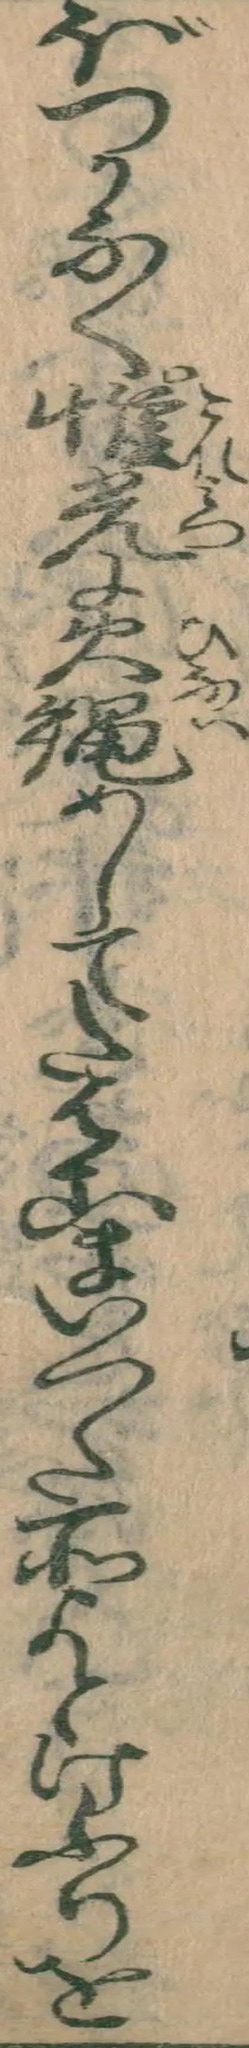ぼつかなく。惟光に火縄めしてたはこまいつた所よとけふりを
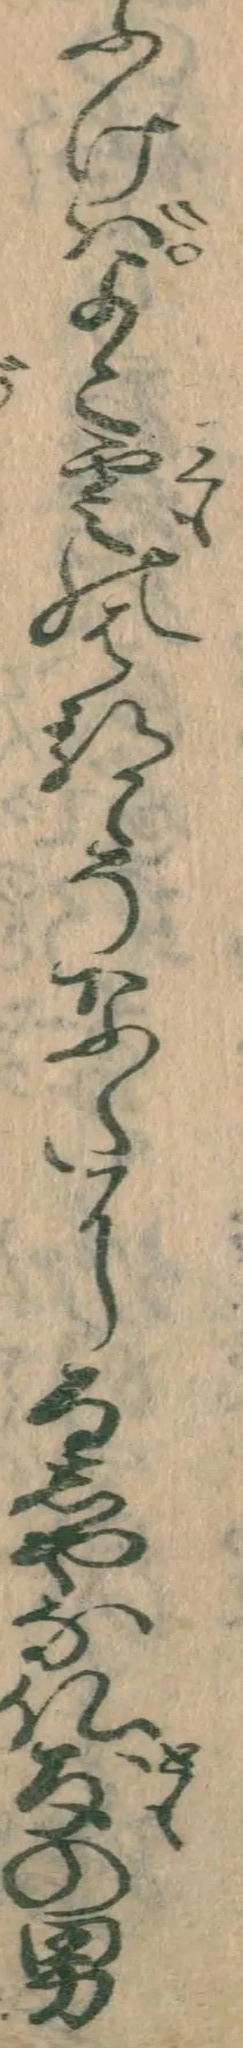ふけば。よこ雲のはるゝそなたにるしやな仏友の男
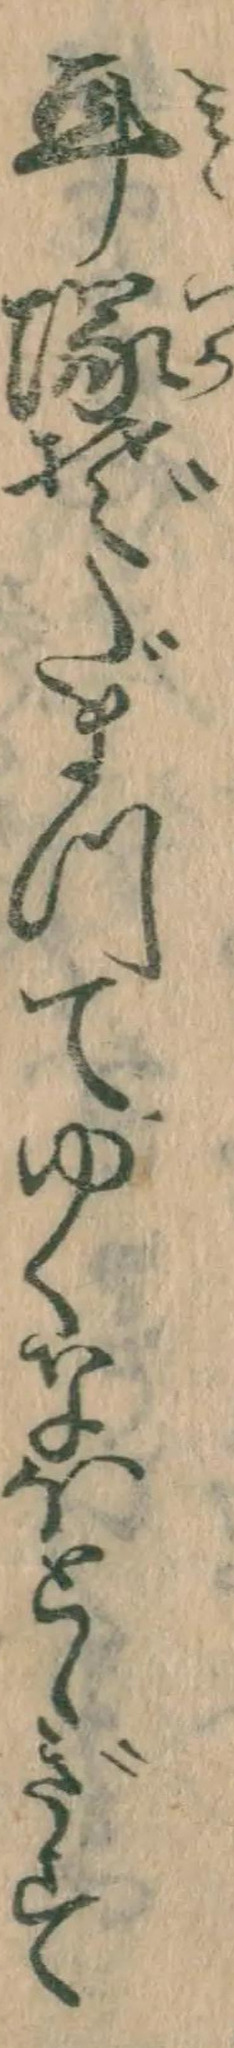耳塚ぞだまつてゆくなほとゝぎす
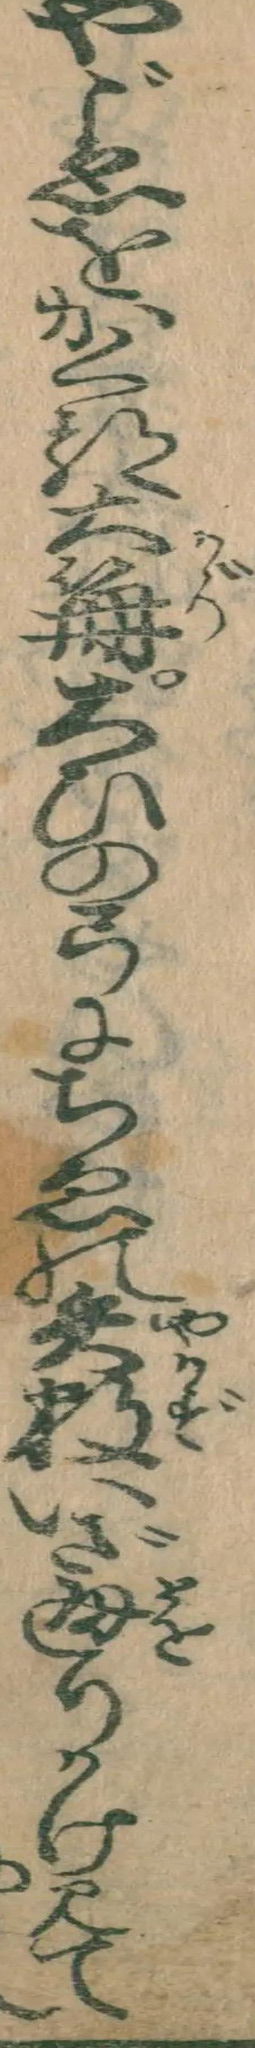やごゑをかくる大篝。大ひの弓にちゑの矢数いざ通りかけ見てゆかん

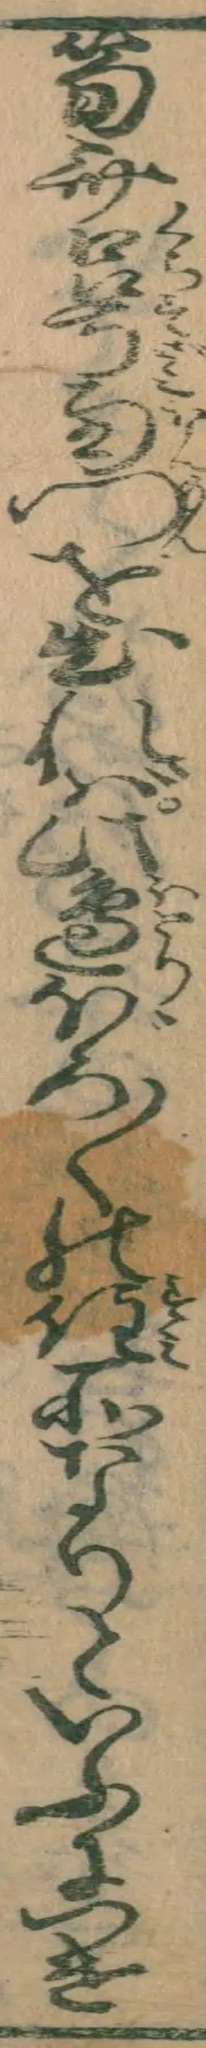筍斎口号南門を出れば。此辺ぼろ〳〵の住所なりといふにつけ
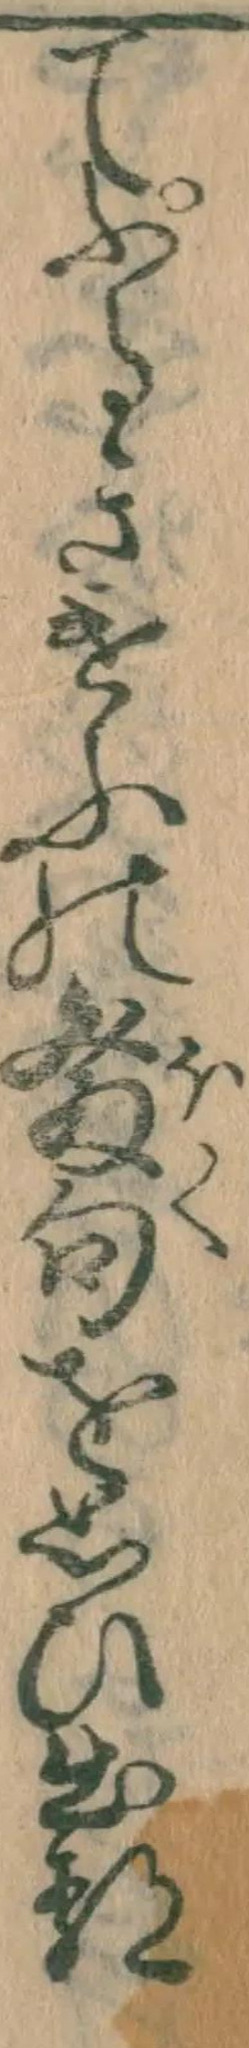て。ふるきけふの発句を思ひ出る
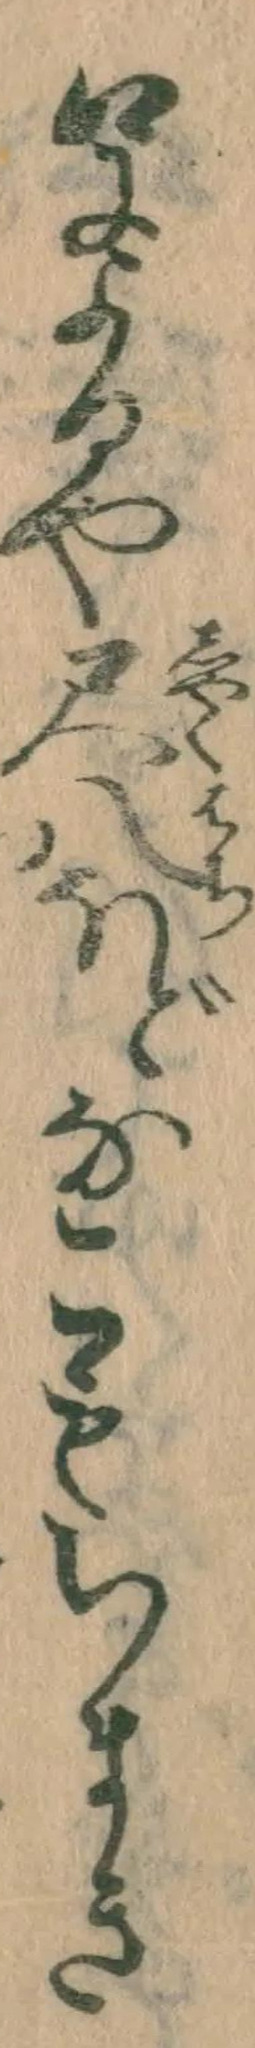口によるや尺八ほどなこもちまき
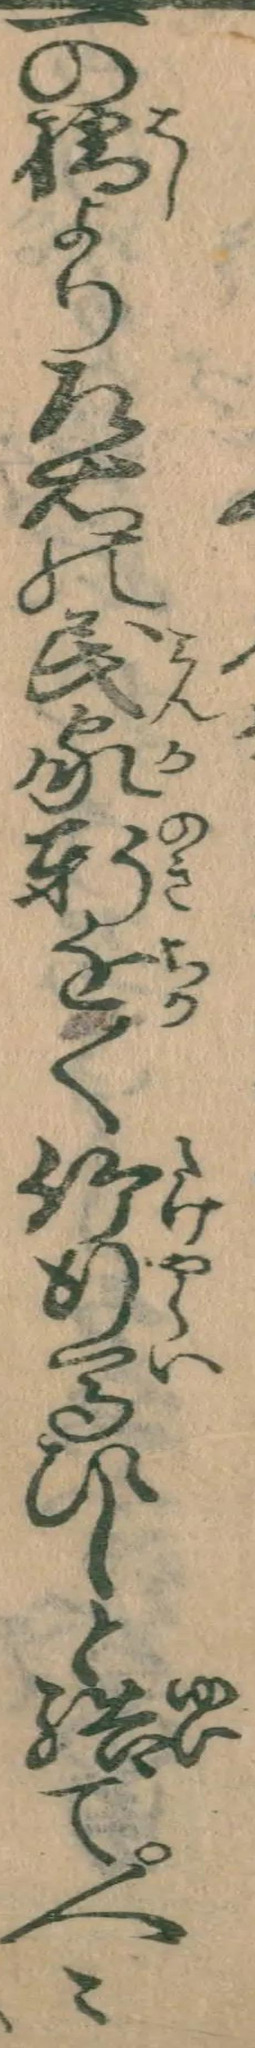一の橋より左右の民家軒近〱竹行馬ひしと結て。人々
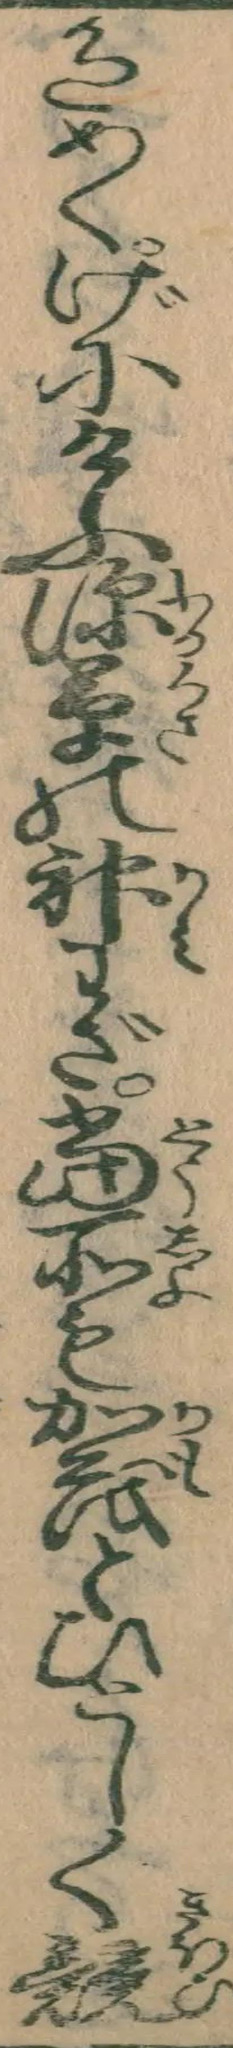色めく。げにけふ深草の神わざ。当所も加茂とひとしく競
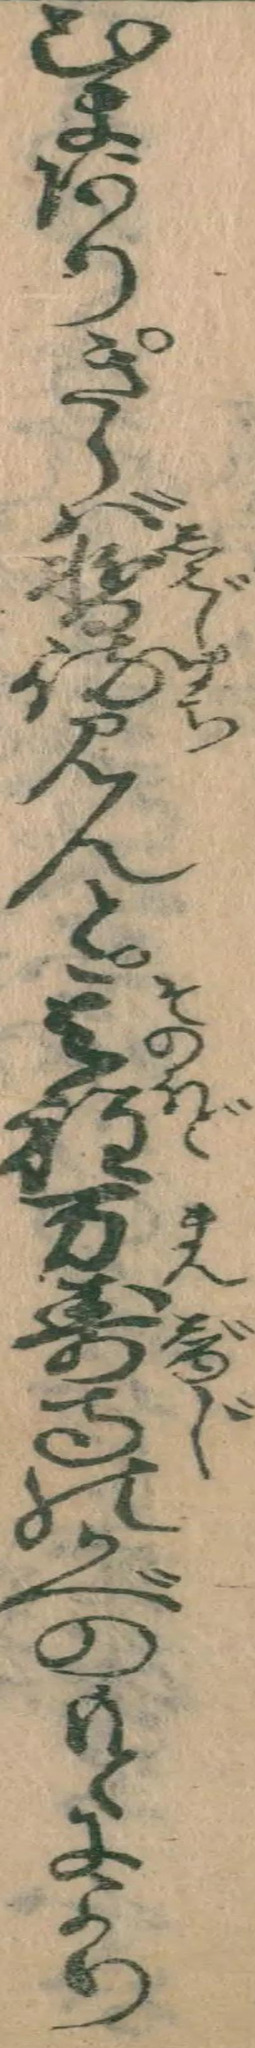むまあり。きらば暫待見んと。其程万寿寺のかべのもとにより
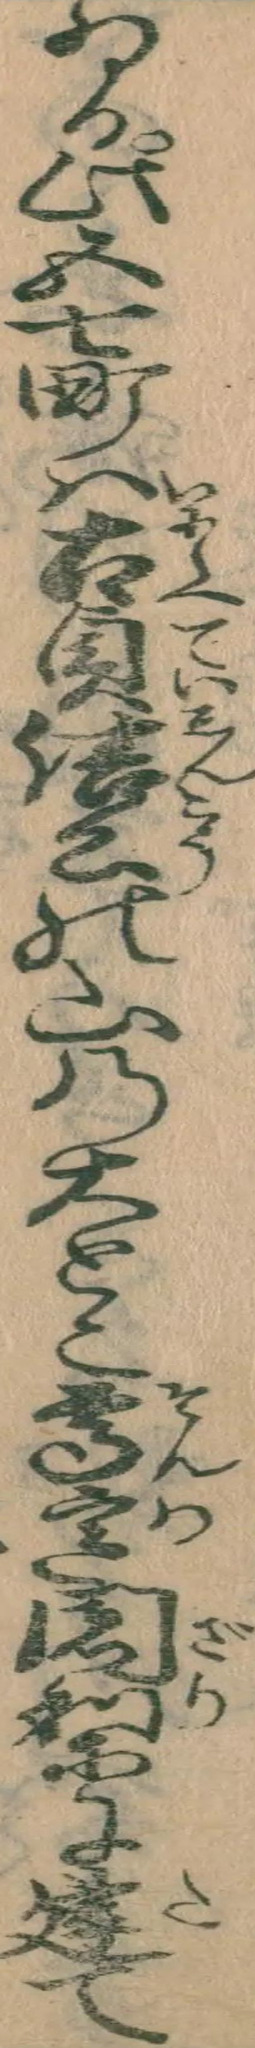ゐる。此五七町は古貞信公の山の大とこ尊意闍梨に建て
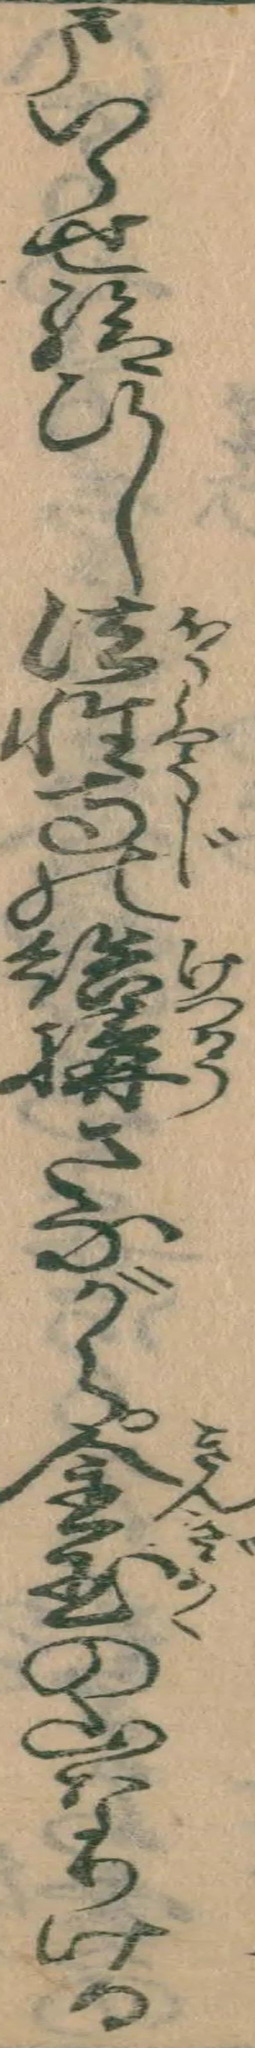まいらせ給ひし法性寺の結構さながら。金玉の山なりける
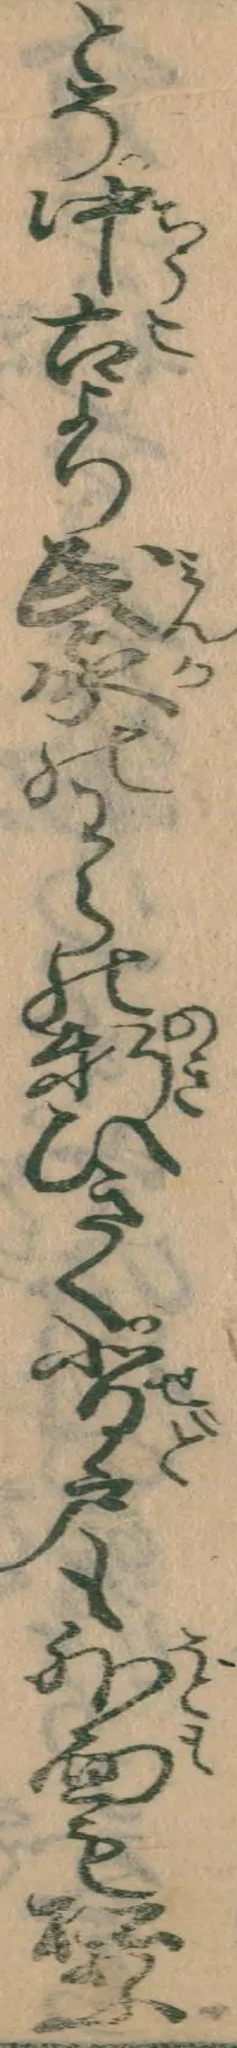とそ。中古より民家のわらの軒ひきく。背戸も外面も松あふ
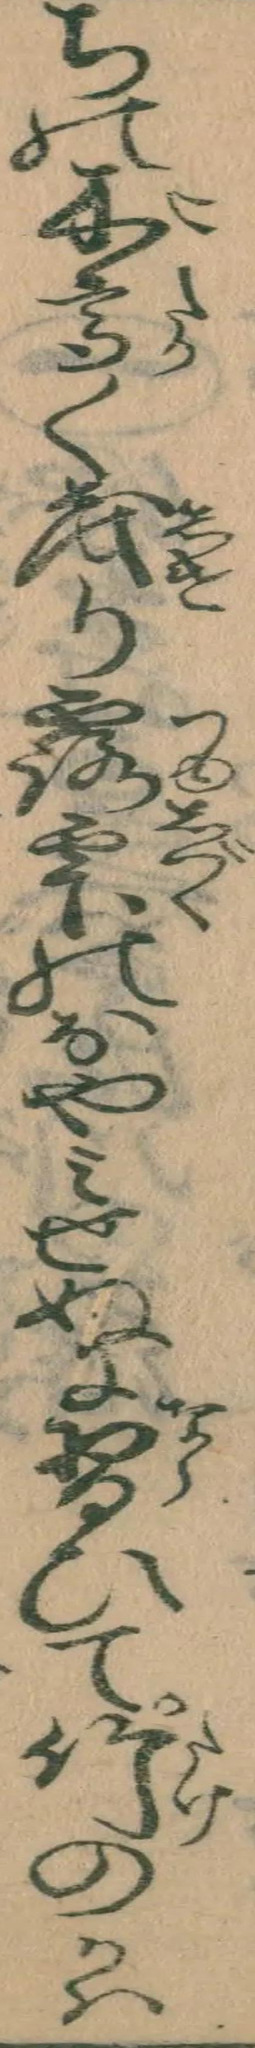ちの木高く茂り露雫のおやみせぬに習ひて。竹のかは
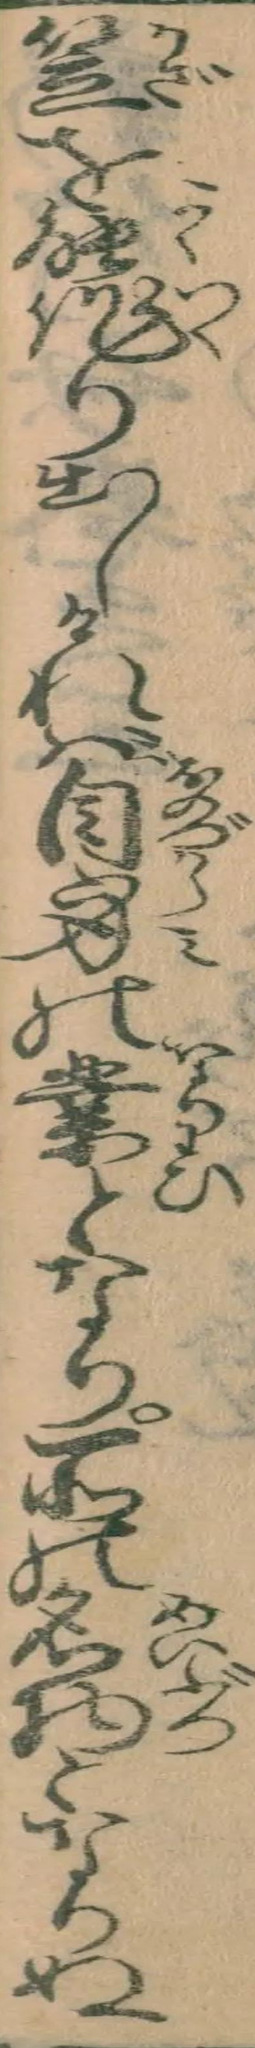笠を能作り出しければ自身の業となり。所の名物となりぬ
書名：新竹斎 5巻
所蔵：国立国会図書館 National Diet Library, JAPAN
